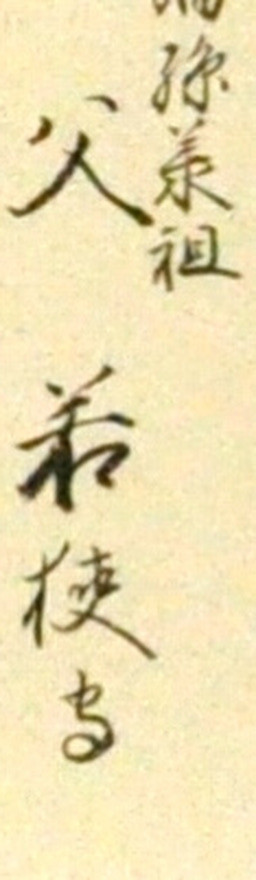父若狭守
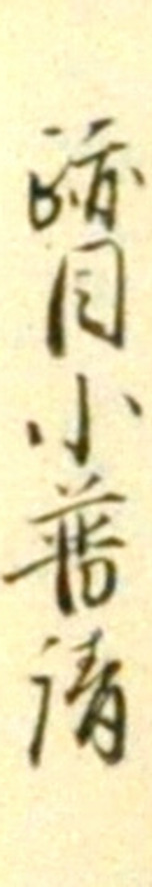跡目小普請

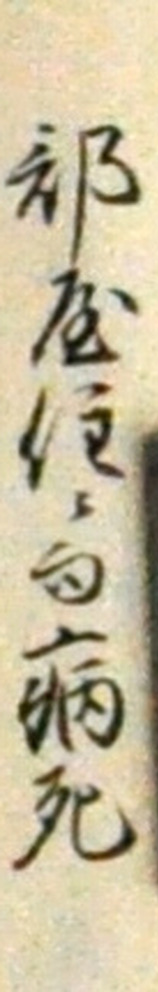部屋住ニ而病死
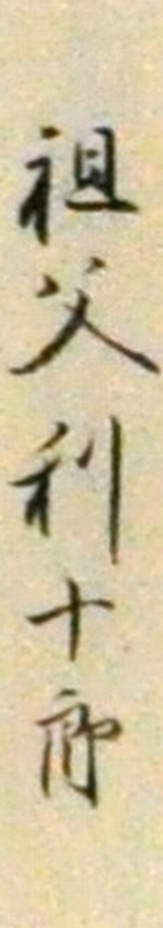祖父利十郎
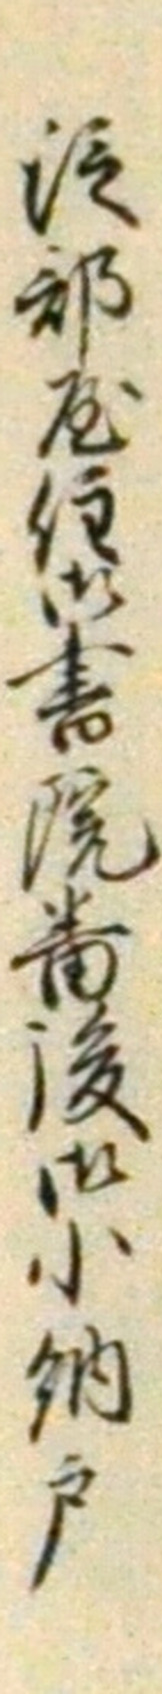従部屋住御書院番後御小納戸
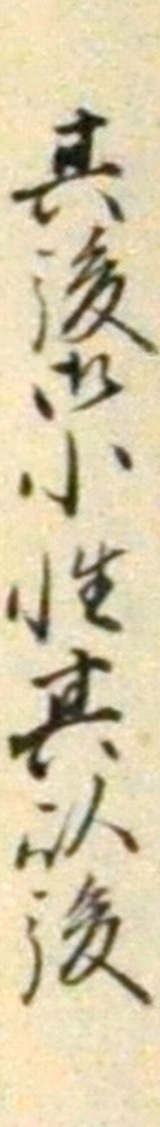其後御小姓其以後
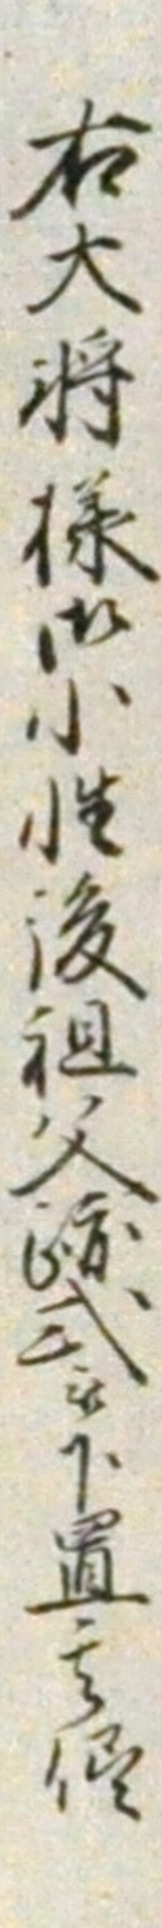右大将様御小姓後祖父跡式被下置其侭
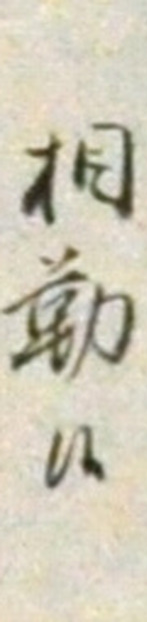相勤候
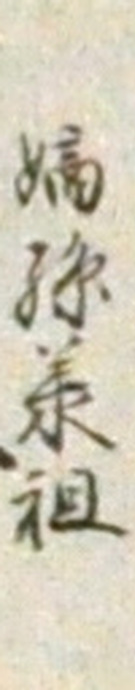嫡孫承祖
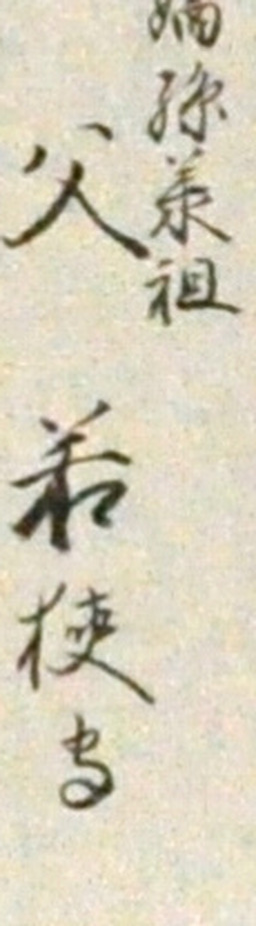父若狭守
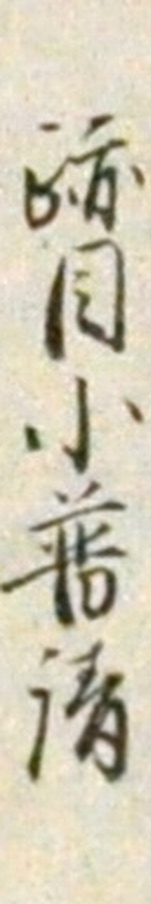跡目小普請
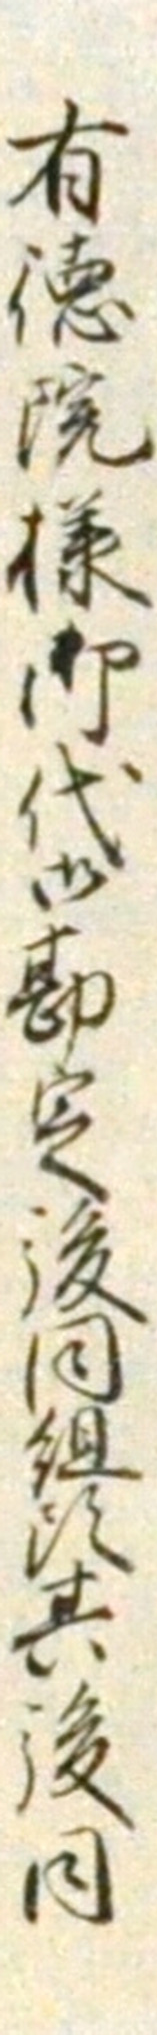有徳院様御代御勘定後同組頭其後同
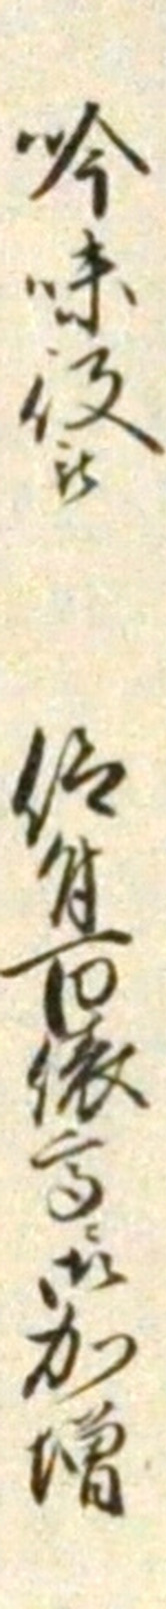吟味役被仰付百俵高ニ加増
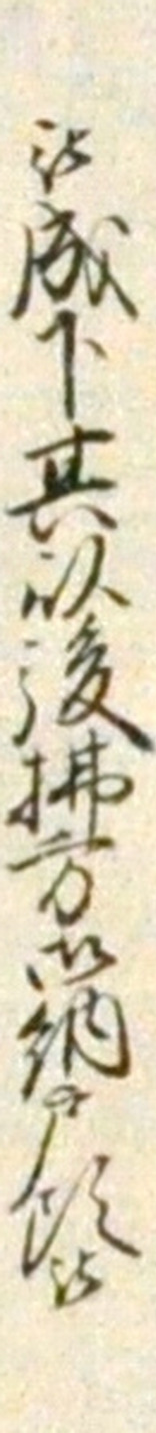被成下其以後拂方御納戸頭被
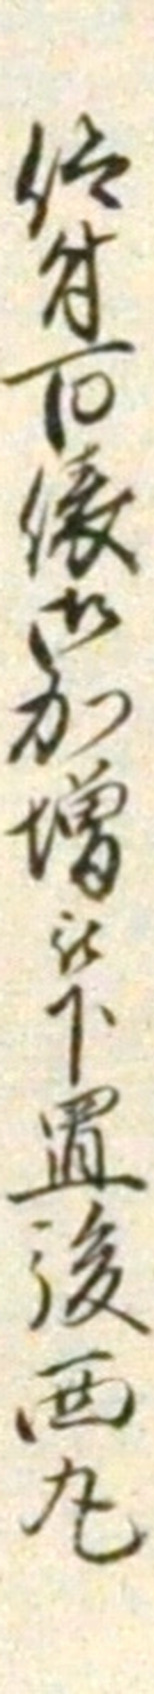仰付百俵高御加増被下置後西丸
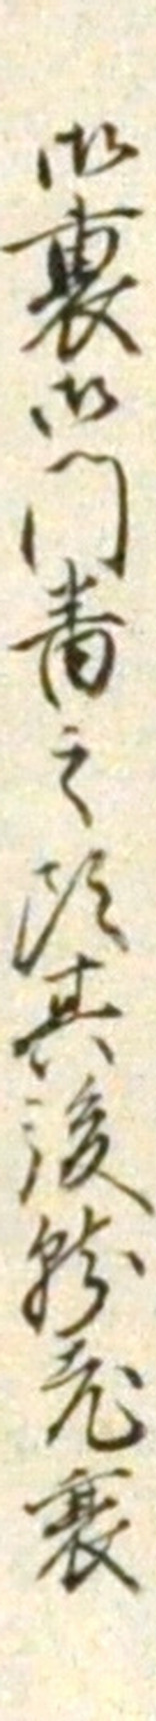御裏御門番之頭其後就老衰
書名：若年寄御役中御調書付
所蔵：伊那市立高遠町図書館・合同会社AMANE
